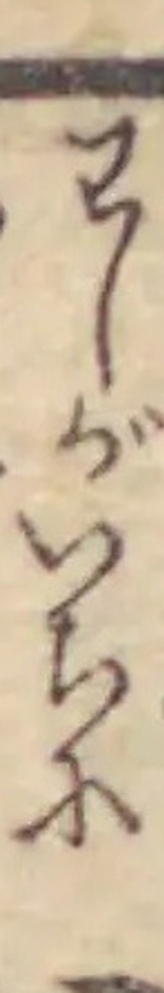わしがいちに
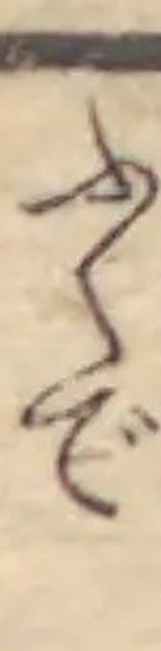ふくで
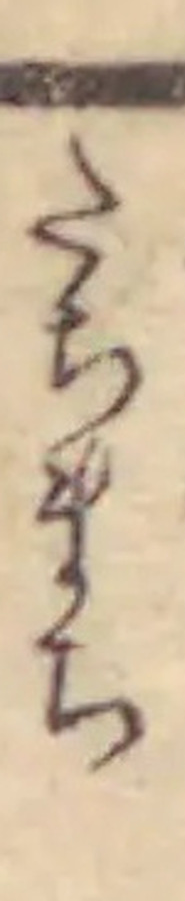たちまち
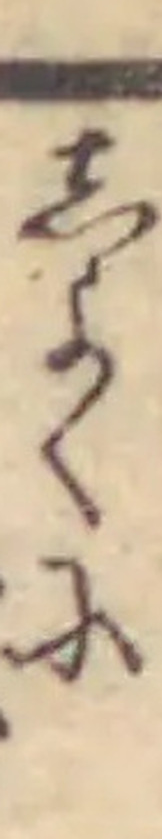しよくに
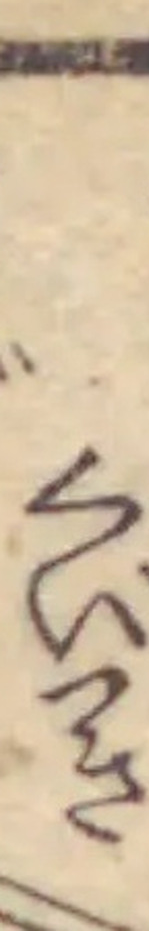くいつき
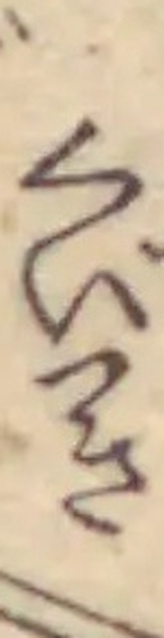くいつき
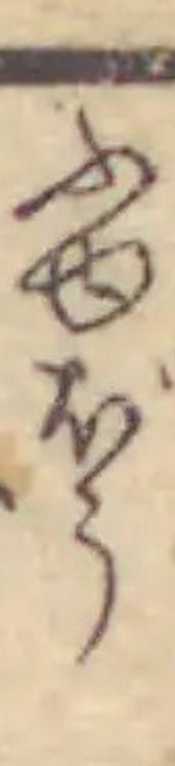ふゆぼう
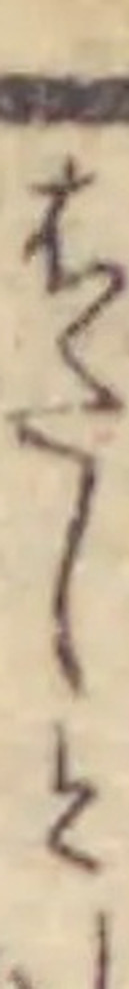はだしと
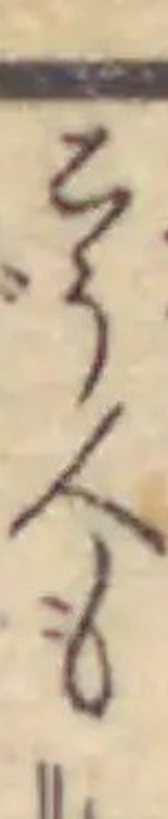こう人も
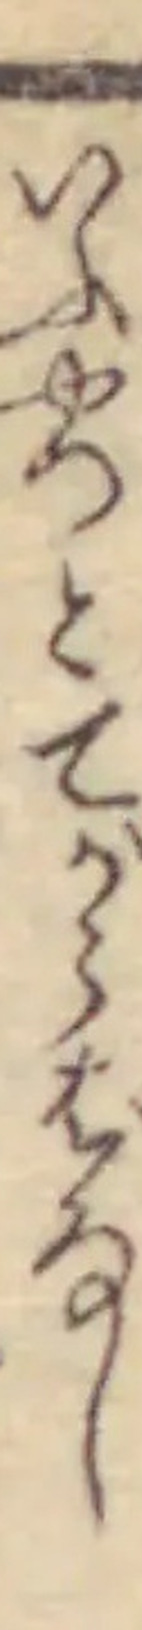いふやつとてがらばなし
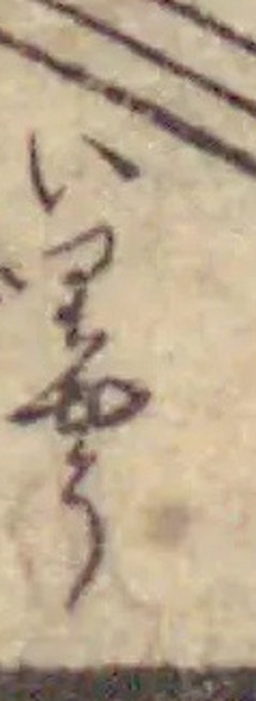いりやう
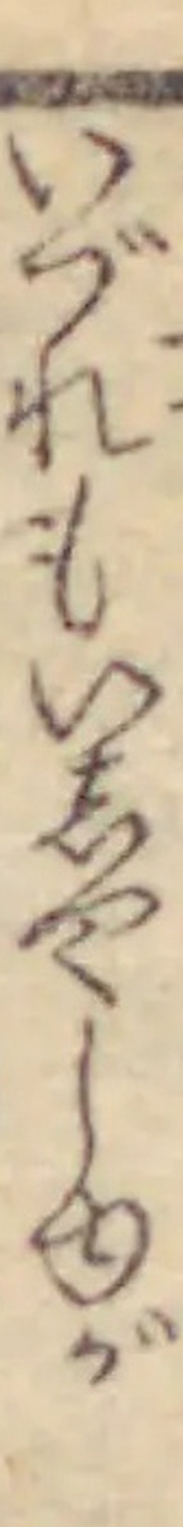いづれもいしやしゆが
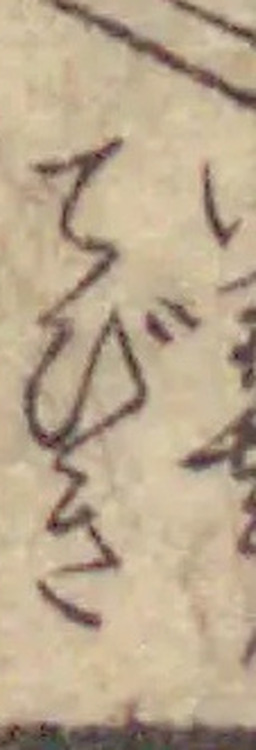てびき
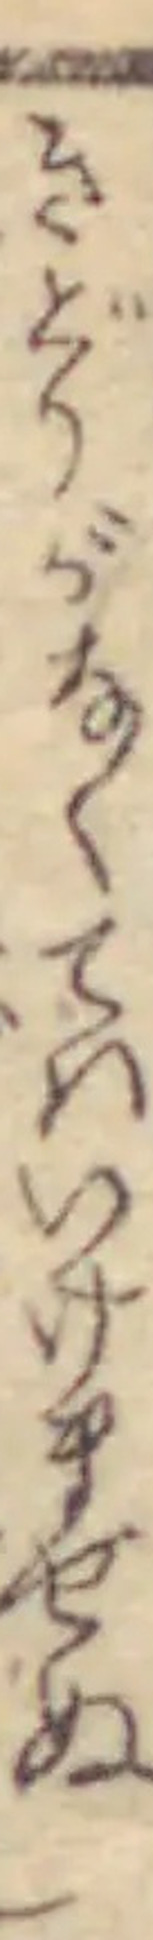きどりがなくてはいけませぬ
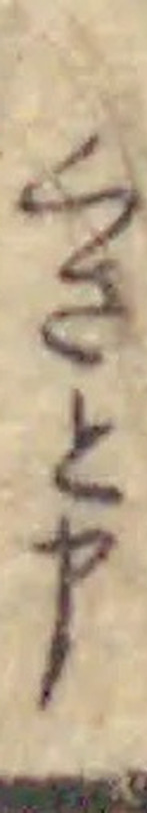くさと申
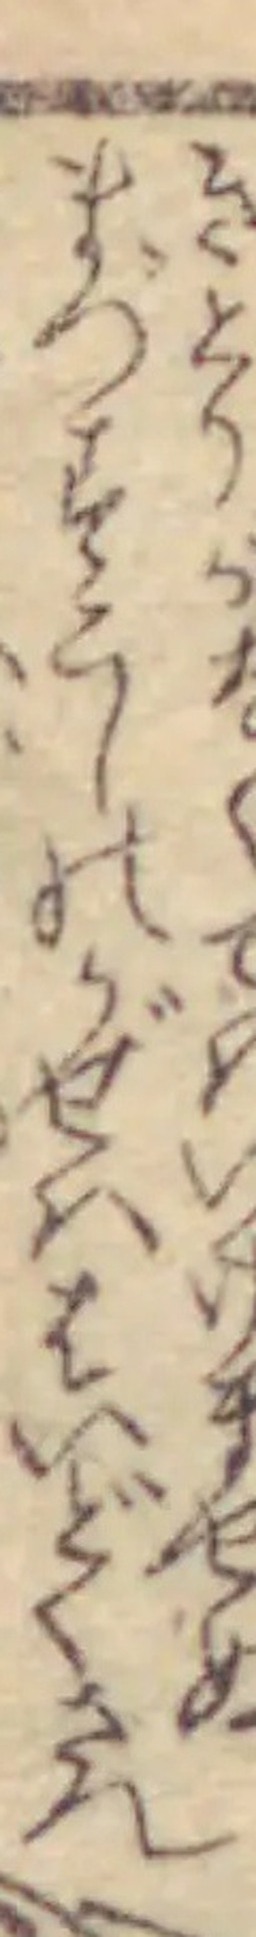まづすこしのかぜははいどくさん
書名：家伝寿命薬 2巻
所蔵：国立国会図書館 National Diet Library, JAPAN
